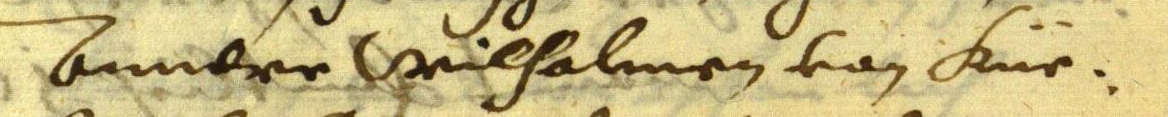Anndre Wilhalmen von Küe¬
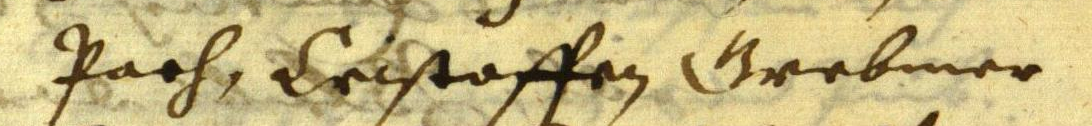Pach, Cristoffen Grebmer
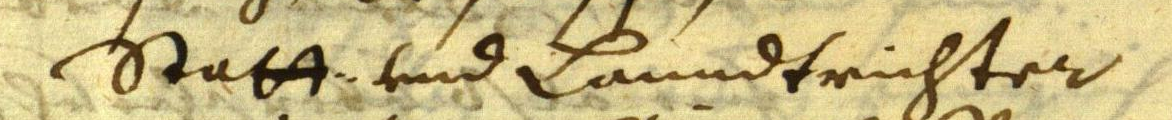Statt: vnd Lanndtrichter
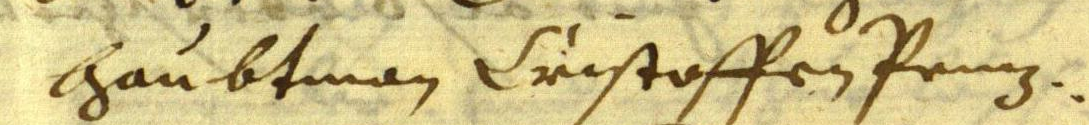Haūbtman Cristoffen Penz¬
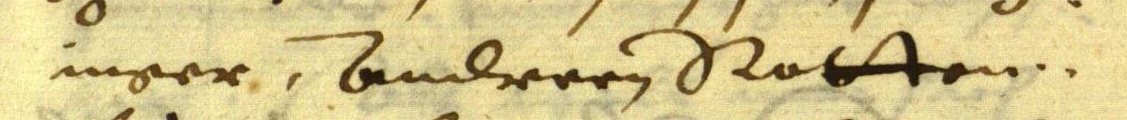inger, Andreen Rotten¬
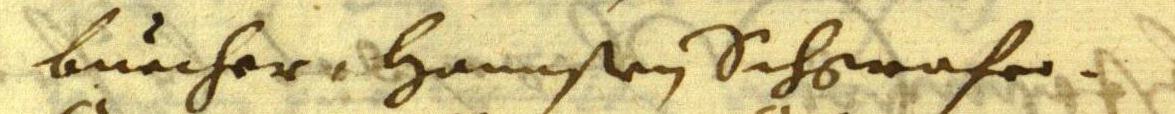būecher, Hannsen Schgrafer.
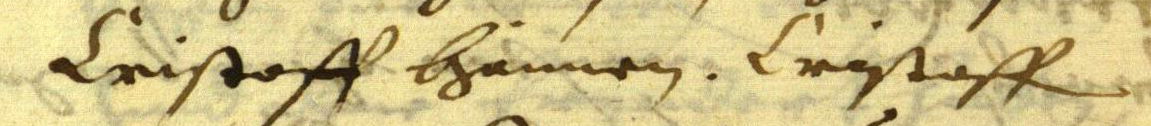Cristoff Haimen. Cristoff
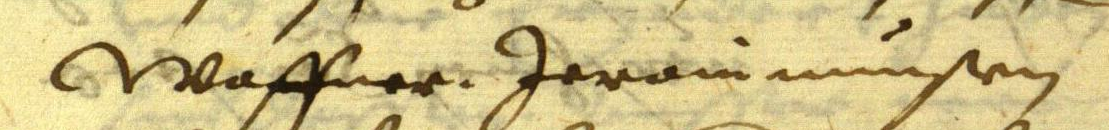Waffner. Jeronimūsen
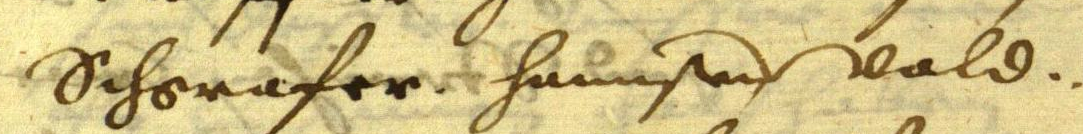Schgrafer. Hannsen Wald¬
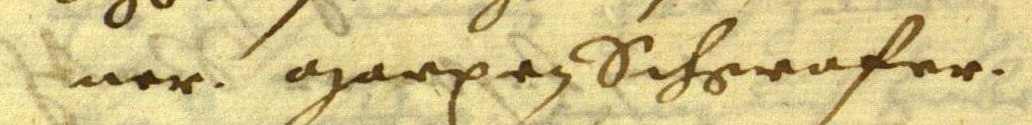ner. Marxen Schgrafer.
